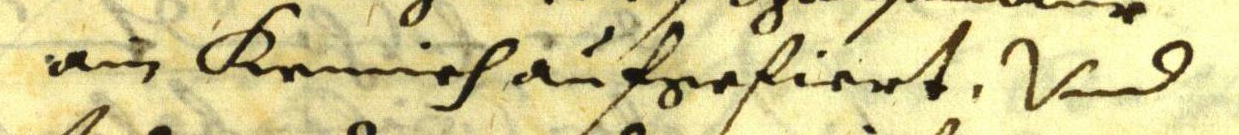ain Kemich aūfgefiert. Vnd
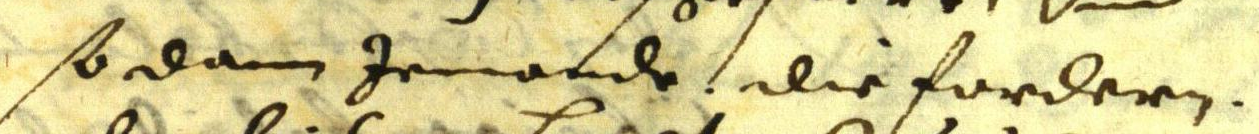so dann Jemande die fordern.
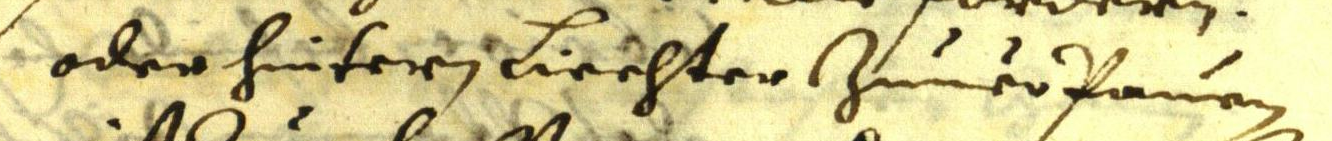oder hintern Liechter ZūuērPaūen
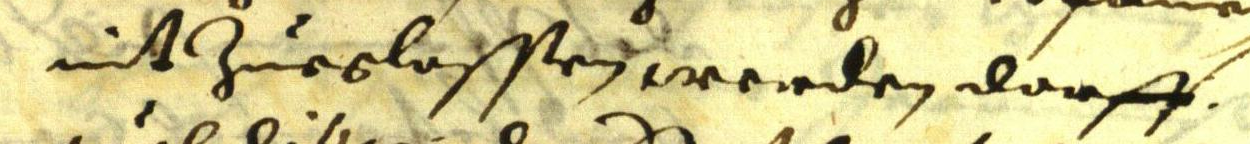nit Zūeglassen werden darff.
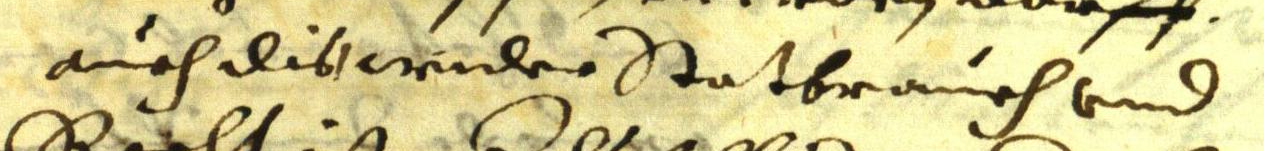aūch dis wider Statbraūch vnd
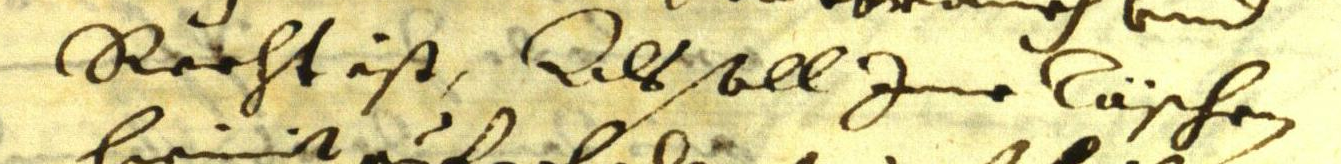Recht ist, Als soll Ime Täschen
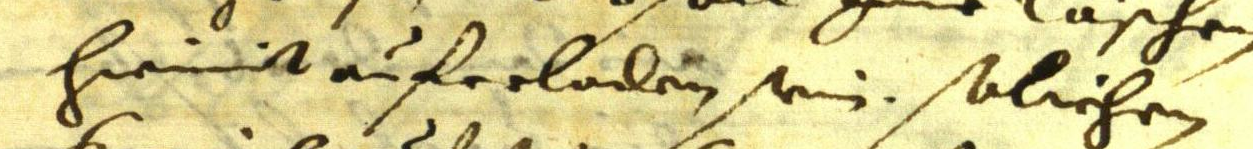hiemit aūferladen sein. solichen
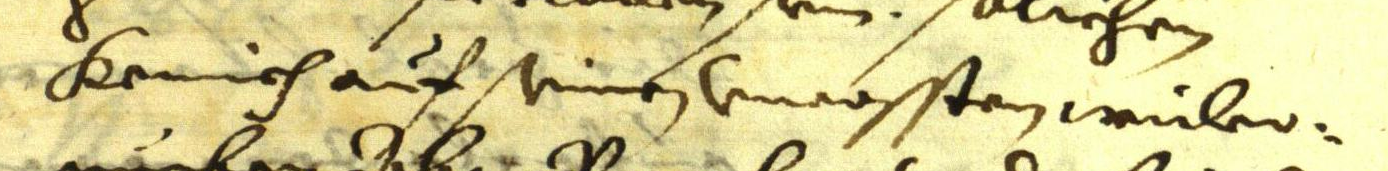Kemich aūf seinen vncossten wider¬
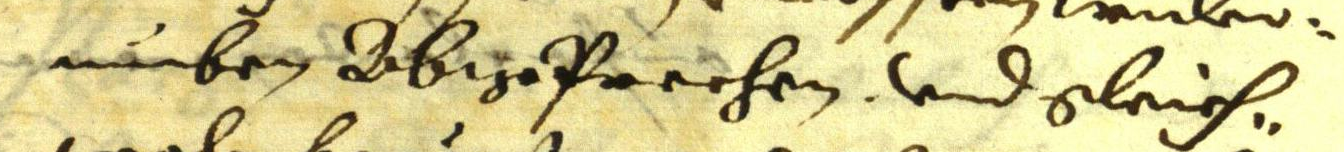ūmben AbzePrechen. vnd gleich¬
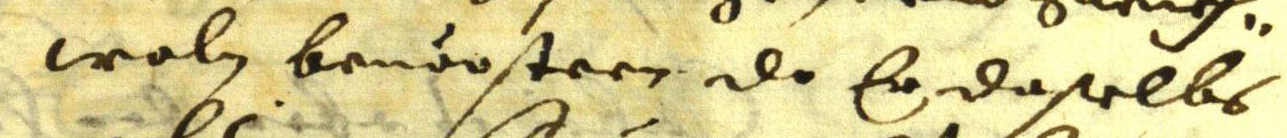woln beuōrsteen da Er daselbs
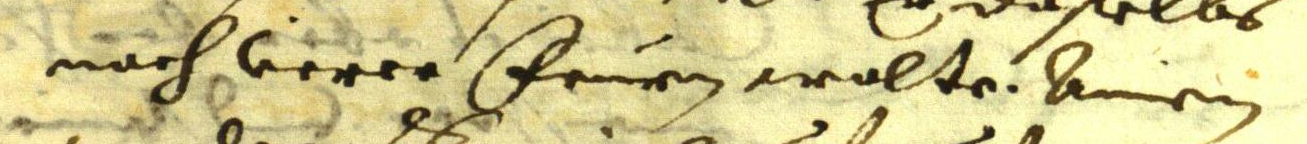noch verer Feūrn wolte. Ainen
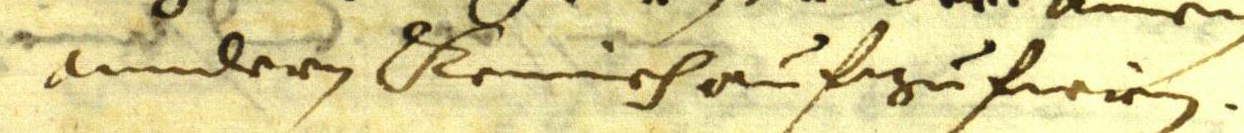anndern Kemich aūfzūfiern.
